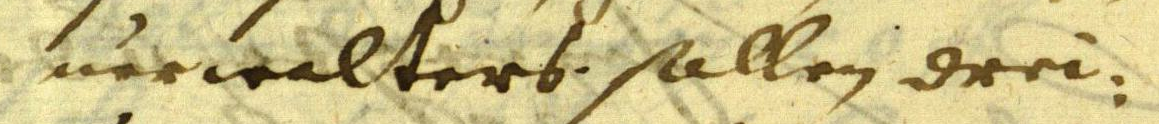ūerwalters. sollen drei¬
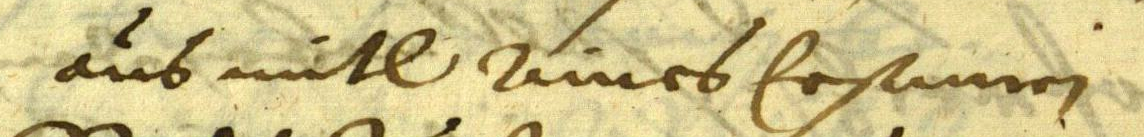aūs mitl Aines Ersamen
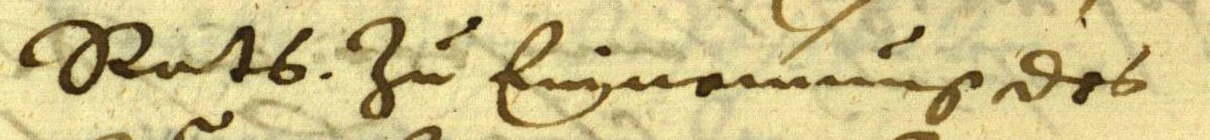Rats. Zū Einnemūng des
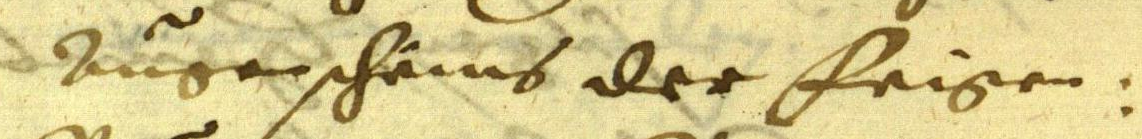Aūgenscheins der Feigen¬
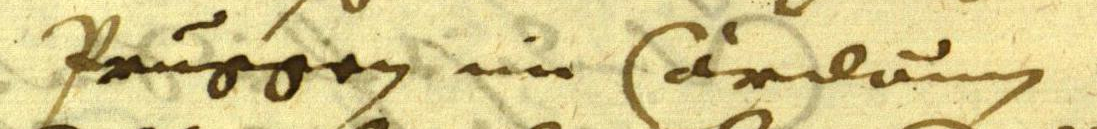Prūggen im Cardaūn
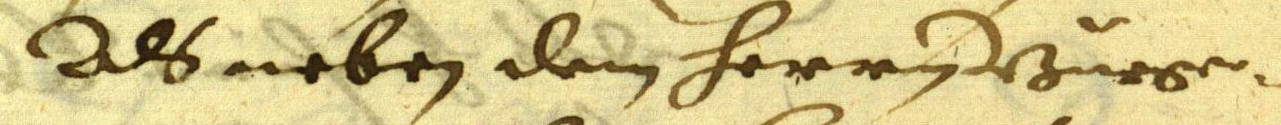Als neben dem herrn Būrger¬
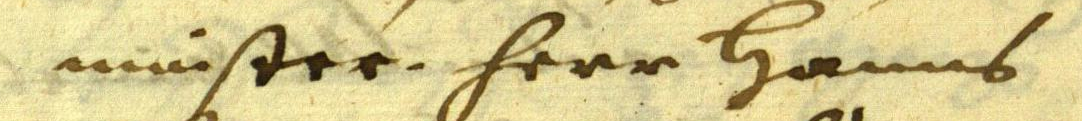maister. herr Hanns
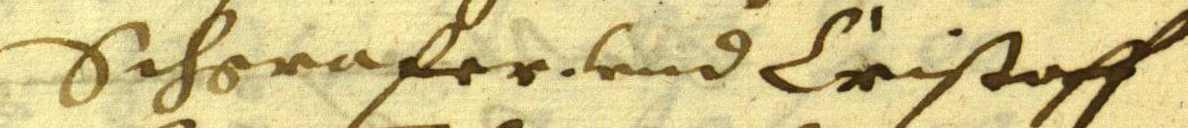Schgrafer. vnd Cristoff
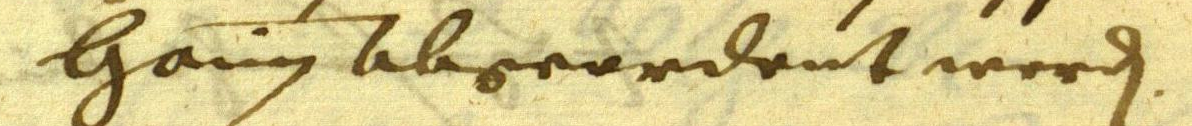Haim Abgeordent werd.
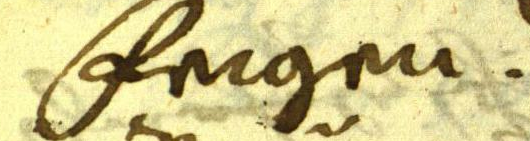Feigen¬
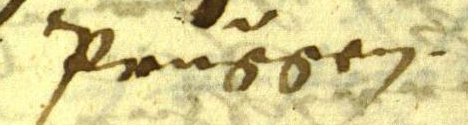Prūggen.
